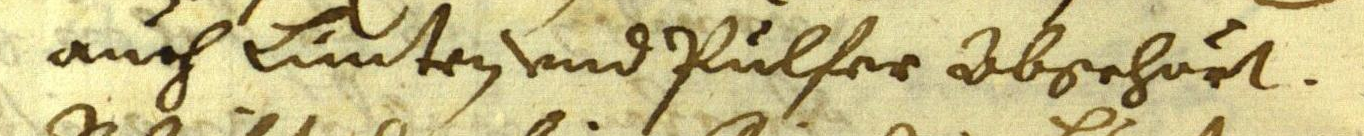aūch Lūnten vnd Pūlfer Abgehōrt.
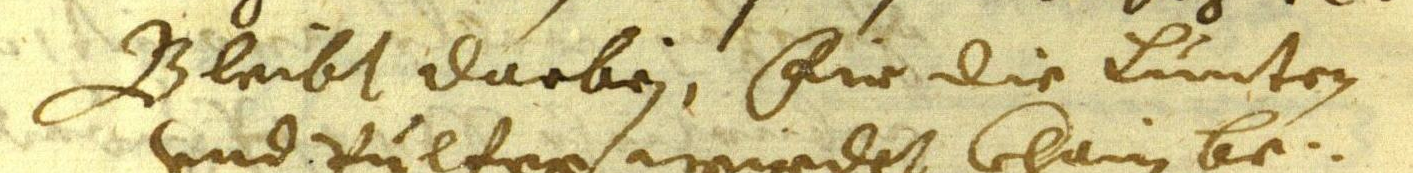Bleibt darbej, Fir die Lūnten
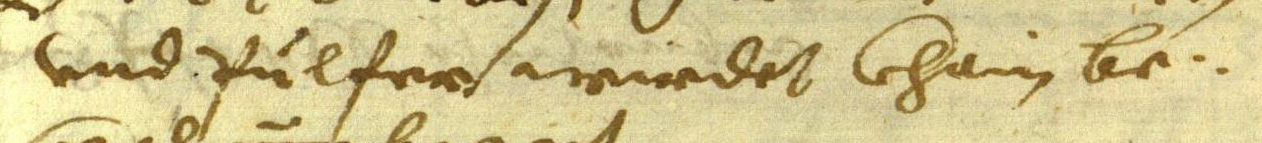vnd Pūlfer wirdet khain be¬
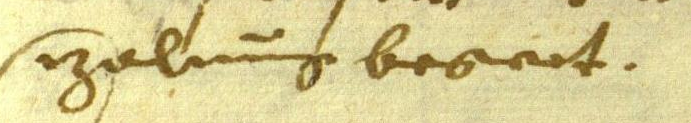zalūng begert.
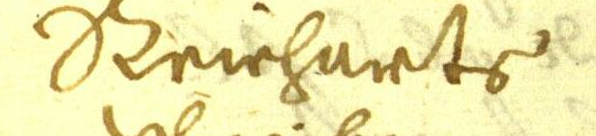Reicharts
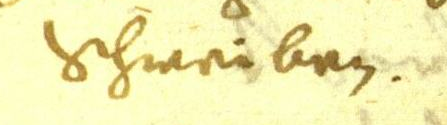Schreiben.
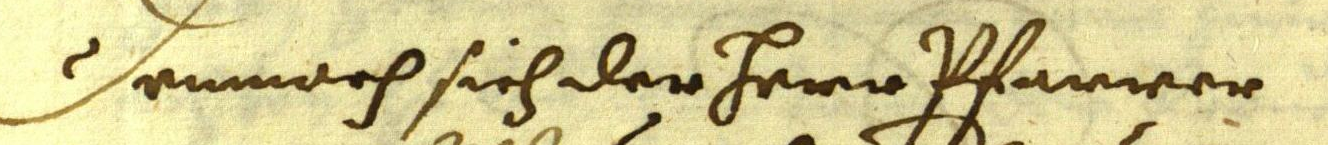Demnach sich der Herr Pfarrer
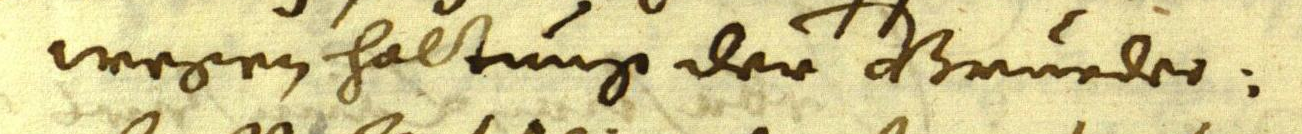wegen haltūng der Brūeder¬
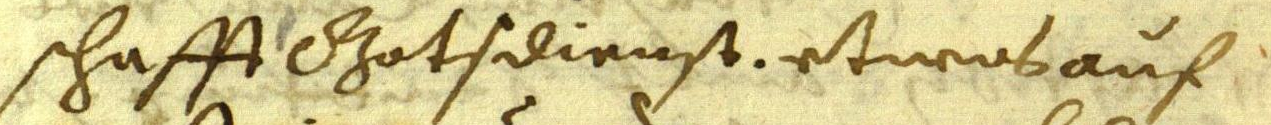schafft Gotsdienst. etwas aūf
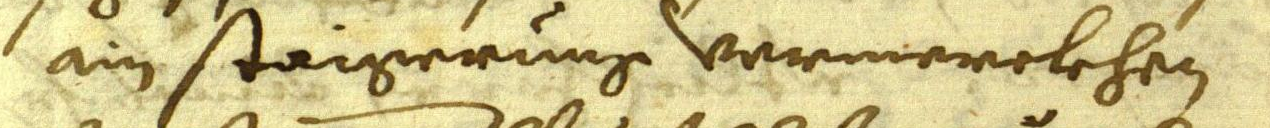ain staigerūng vermerckhen
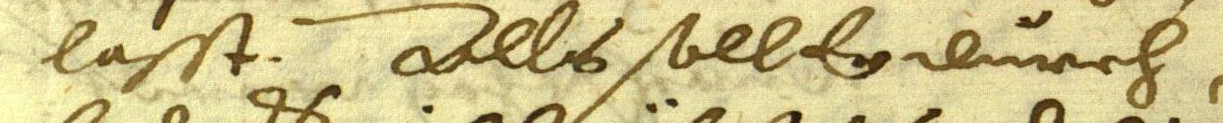lasst. Alls soll Er dūrch
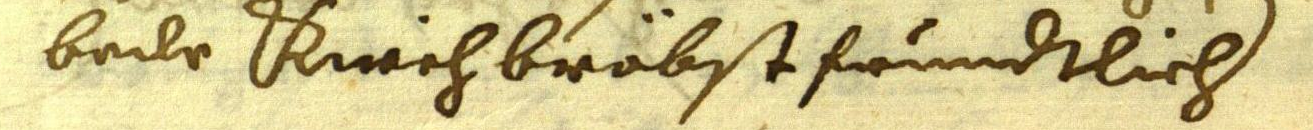bede Kirchbröbst frūndtlich
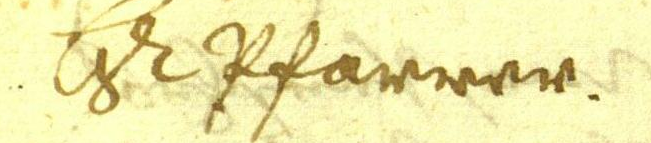H Pfarrer.
